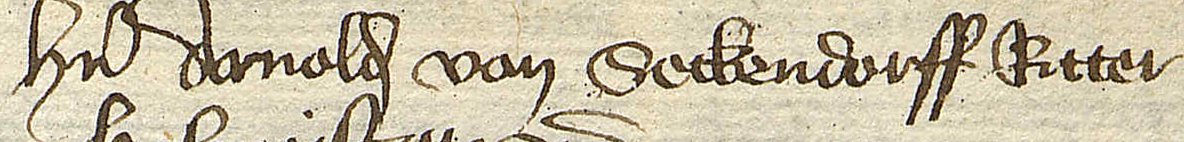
hn* Arnold* von Seckendorff Ritter
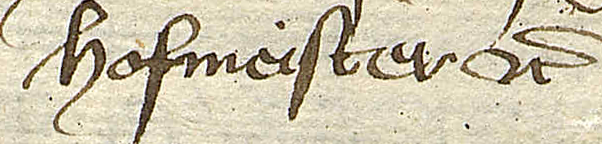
hofmeiſter ec*
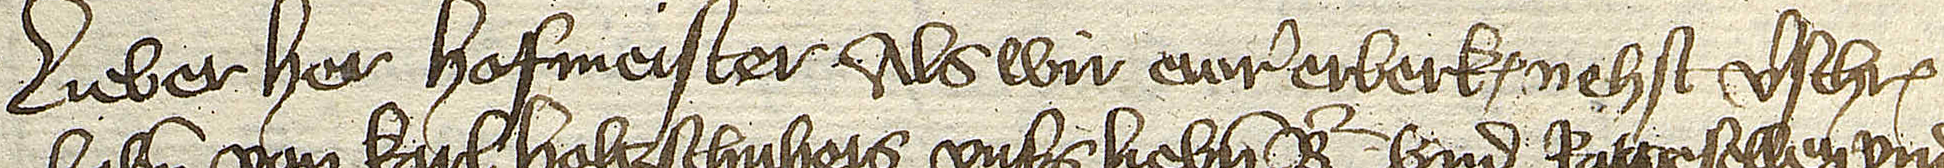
Lieber her hofmeiſter Als wir ewr* erberk* nehſt v*ſchr*
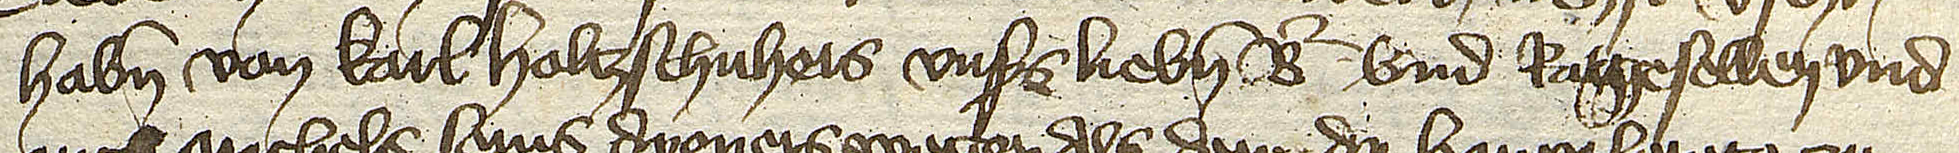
habn* von karl holcʒſchuhers vnſ*s liebn* B* vnd Ratgeſellen vnd
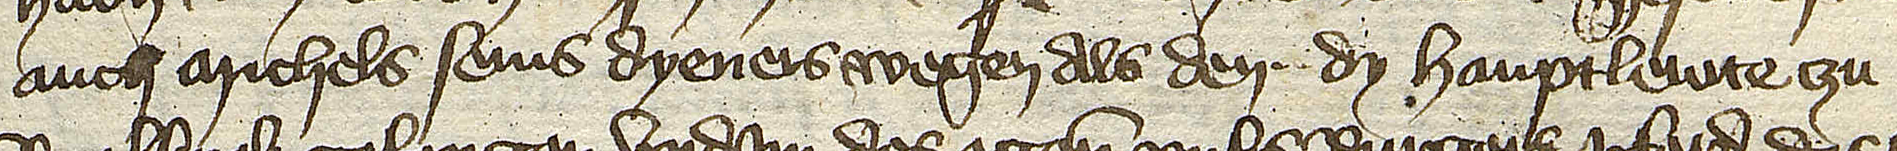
auch Michels ſeins dyeners wegen Als den ~ dy hauptlewte cʒu
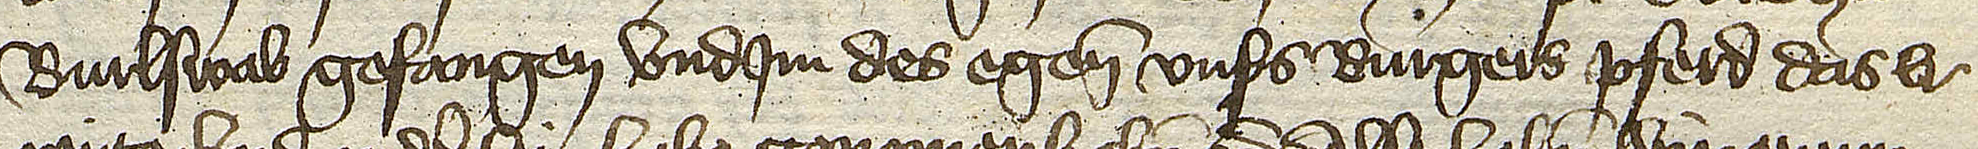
Burlſwab gefangen vnd Im des egen* vnſ*s Burgers pferd das Er
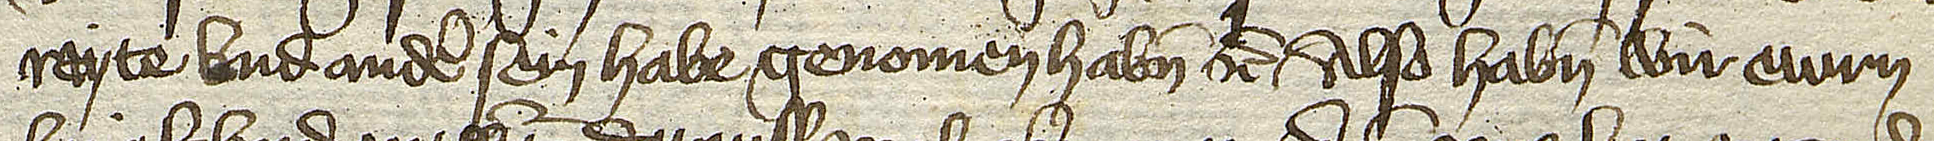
reyte vnd and* ſein habe genomen habn* ec* / Alſo habn* wir ewrn
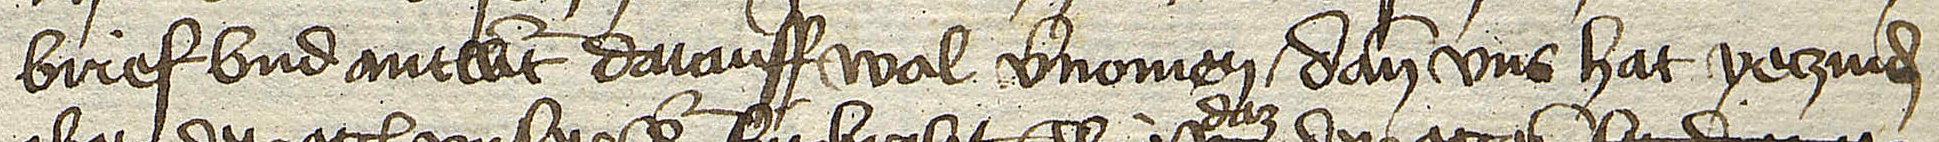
brief vnd antw*t darauff wol v*nomen / dan* vns hat yecʒund*
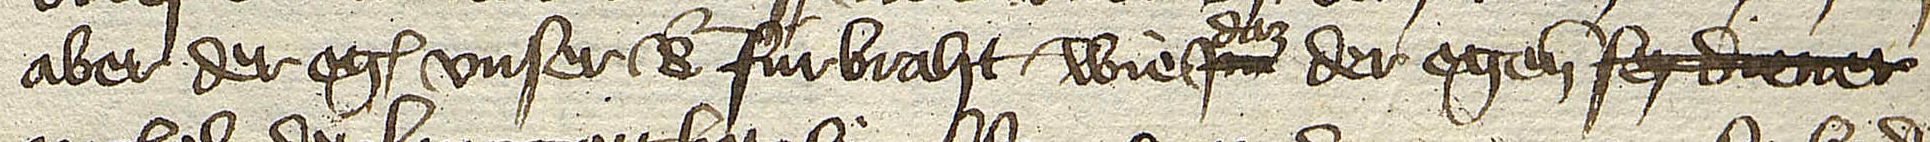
aber der eg* vnſer B* fürbraht / wie Im der egen* ſey diener
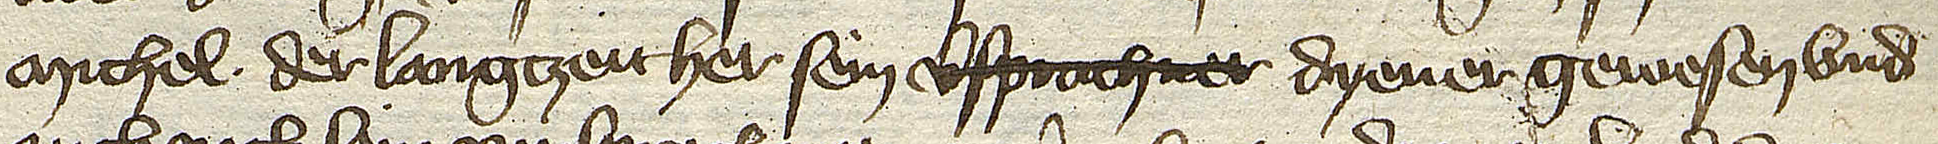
Michel . der langcʒeit her ſein v*ſprochner dyener geweſen vnd
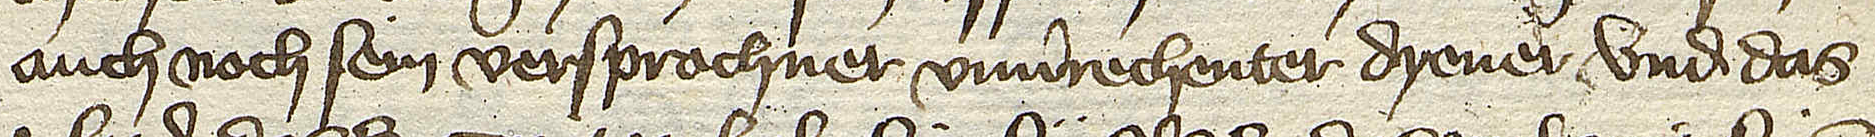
auch noch ſein verſprochner vnu*rechenter dyener / vnd das
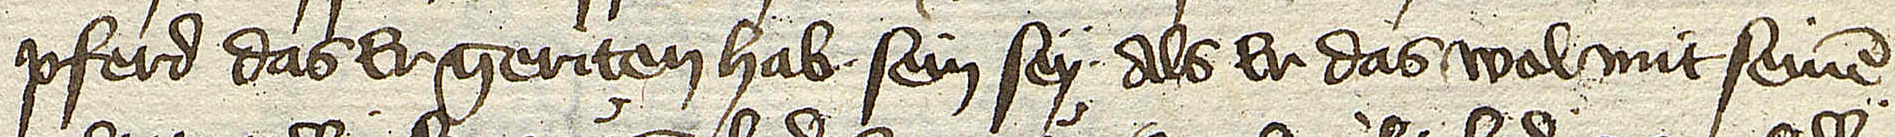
pferd das Er geriten hab / ſein ſey / Als Er das wol mit ſeine*
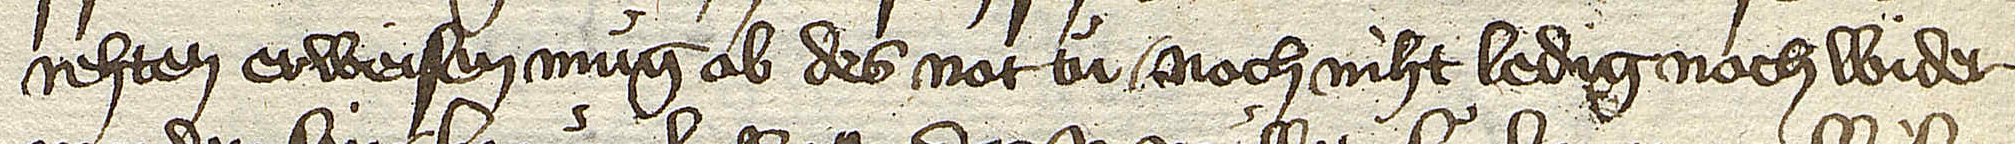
rehten erweiſen müg ob des not tü / noch niht ledig noch wider
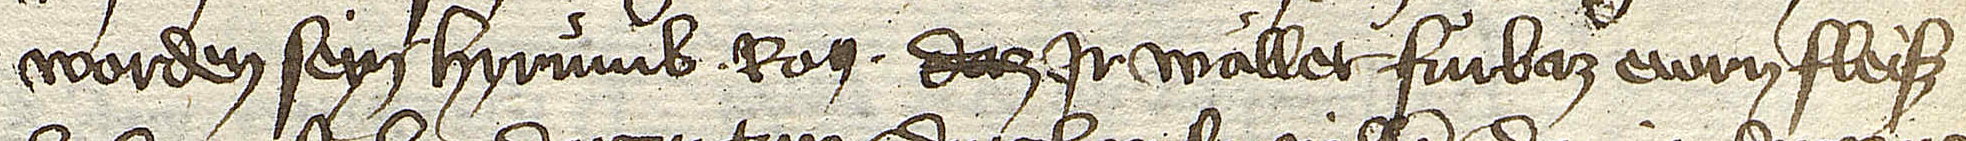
worden ſeyn hyrümb . Ro* . daʒ Ir wöllet fürbaʒ ewrn fleiſʒ
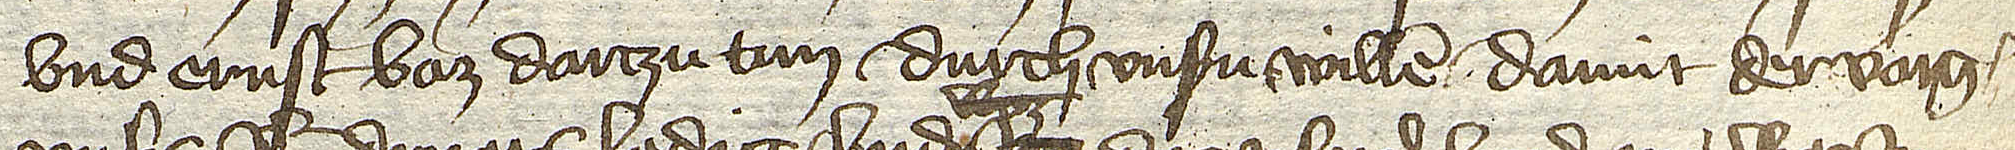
vnd ernſt baʒ darcʒu tun / durch vnſ*n wille* / damit der vorg*
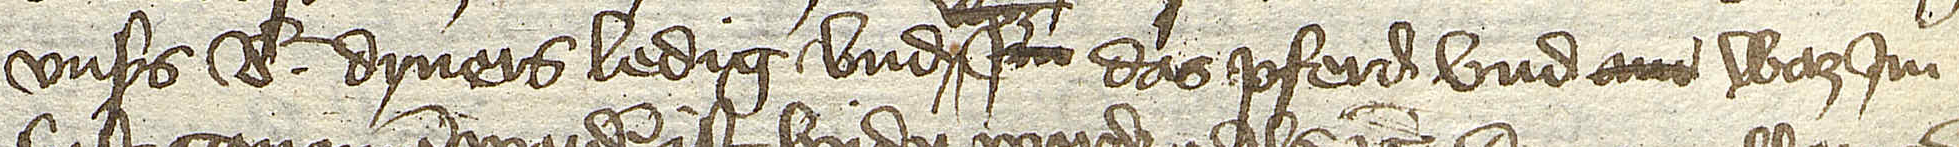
vnſ*s B* . dyners ledig / vnd Im das pferd vnd an waʒ Im
